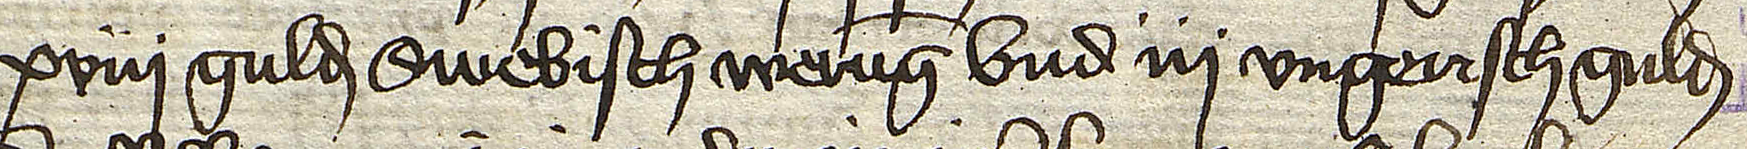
xviii guld* Swebiſch weru*g vnd iii vngeriſch guld*
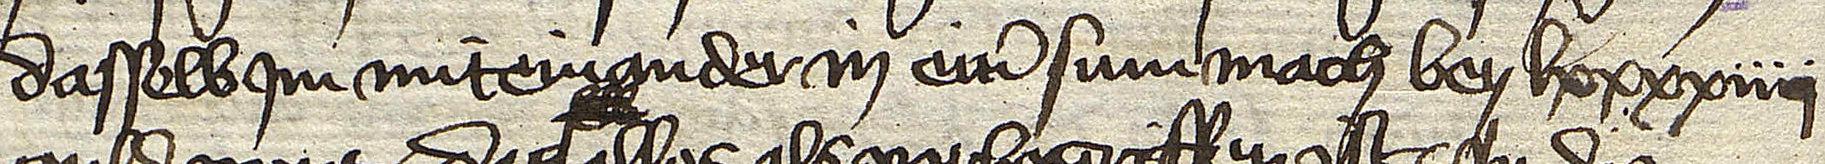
daſſelb Im miteinander in ein* ſum mach bey lxxxiiii
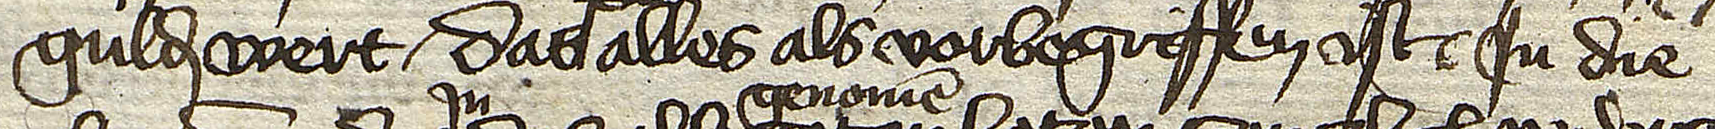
guld* wert / Das alles als vorbegriffen iſt / In die
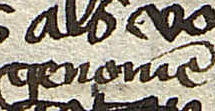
genome*
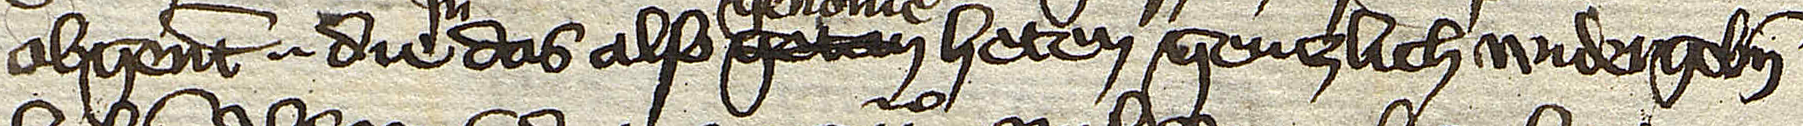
obgent* ~ die das alſo getan heten gencʒlich widergebn*
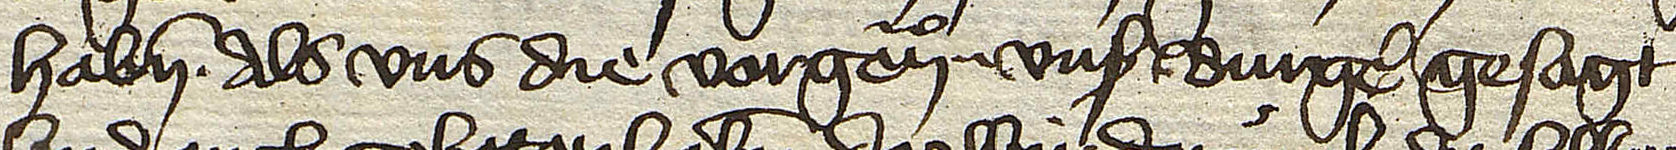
habn* . Als vns die vorgen* ~ vnſ* Burge* geſagt
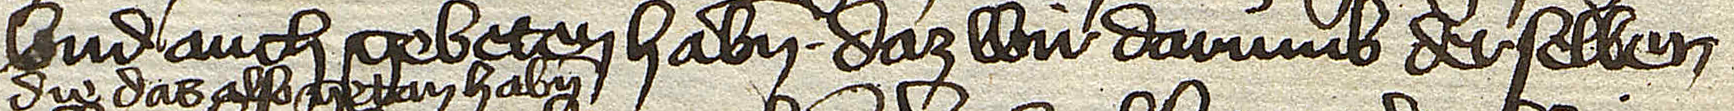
vnd auch gebeten habn* . daʒ wir darümb derſelben
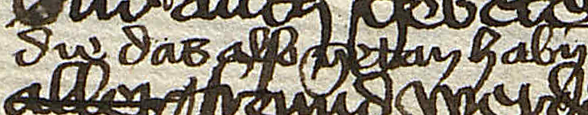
die das alſo getan habn*
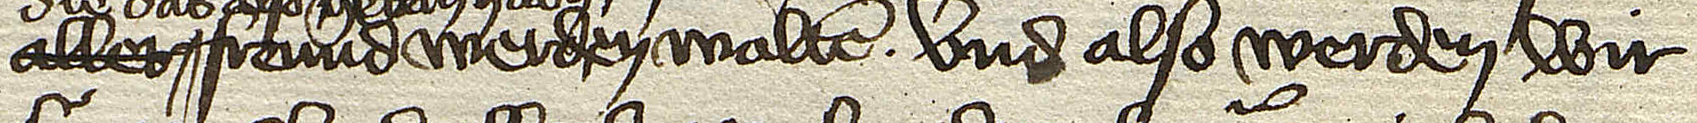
aller freund werden wolte* . Vnd alſo werden wir
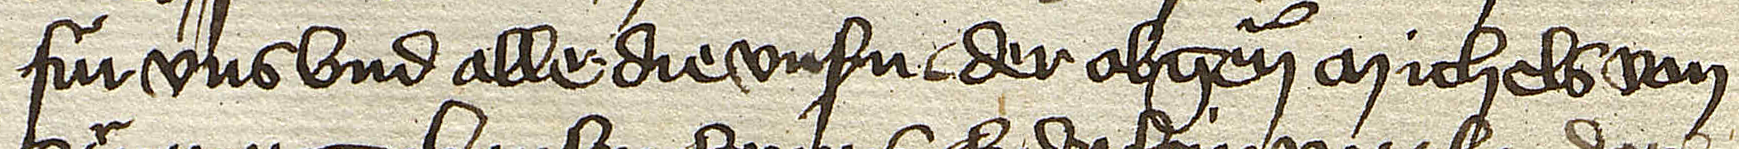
für vns vnd alle die vnſ*n / der obgen* Michels von
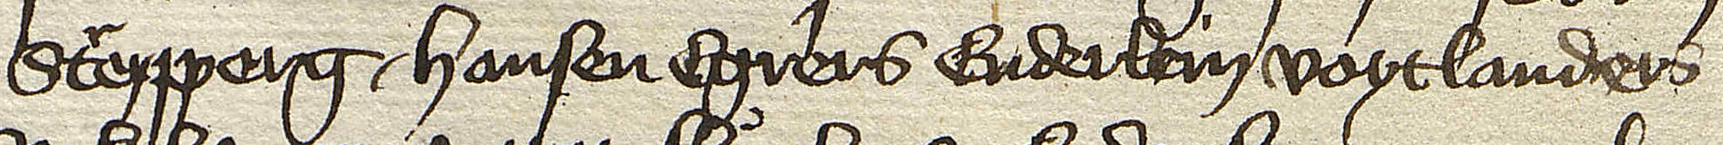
Steypperg / hanſen Egrers Enderlein voytlanders
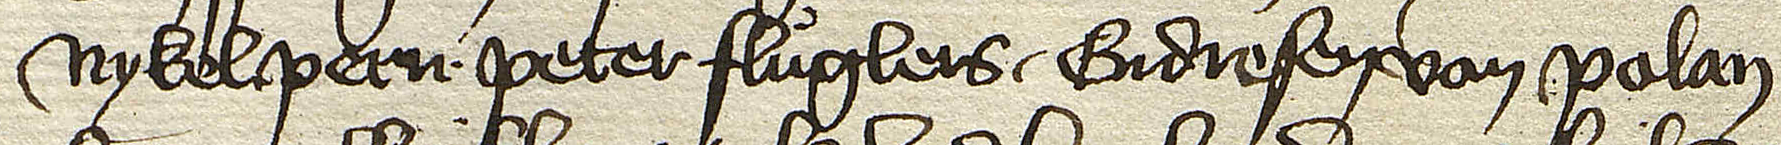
Nykel Pern . Peter flüglers / Endreſen von Polan
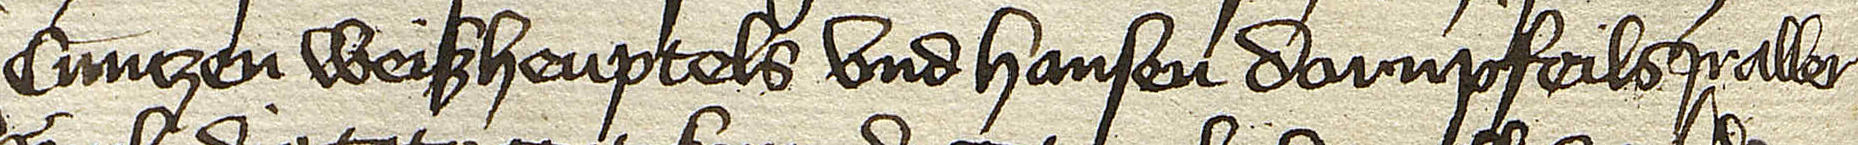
Cuncʒen weiſʒheuptels vnd hanſen Dornpfeils Ir aller
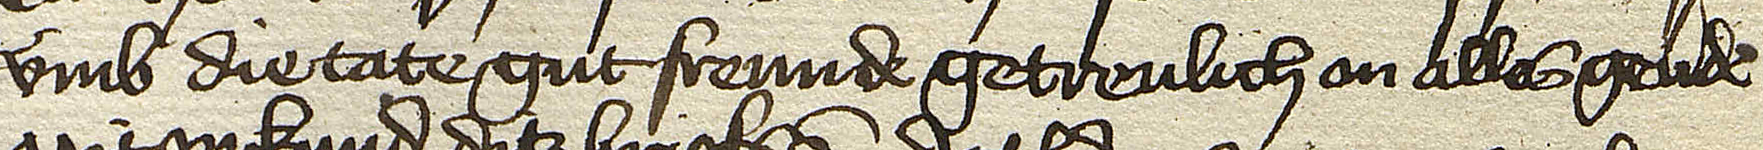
v̈mb die tate gut freunde getreulich on alles geu*de
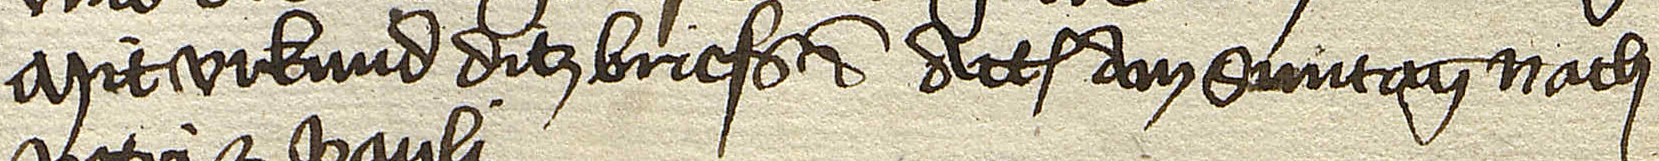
Mit vrkund dicʒ briefs ec* Act* Am Suntag nach
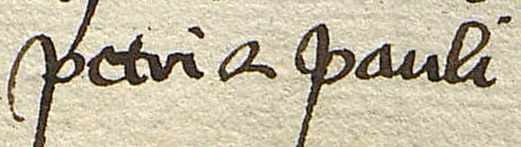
Petri et Pauli
